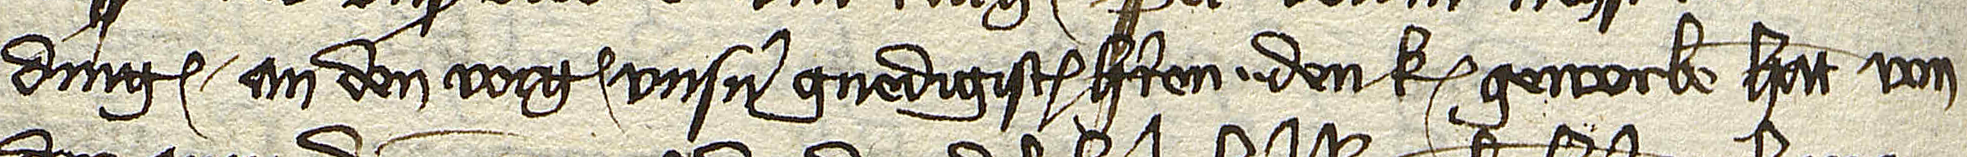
ding* / an den vorg* vnſ*n gnedigiſt* h*ren ~ den k* geworbe* hat von
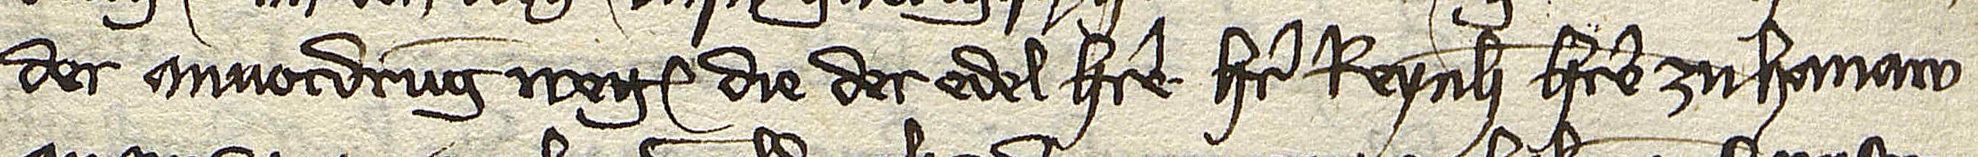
der anuordru*g weg* die der edel h*re . hr* Reynh* h*re ʒu hanaw
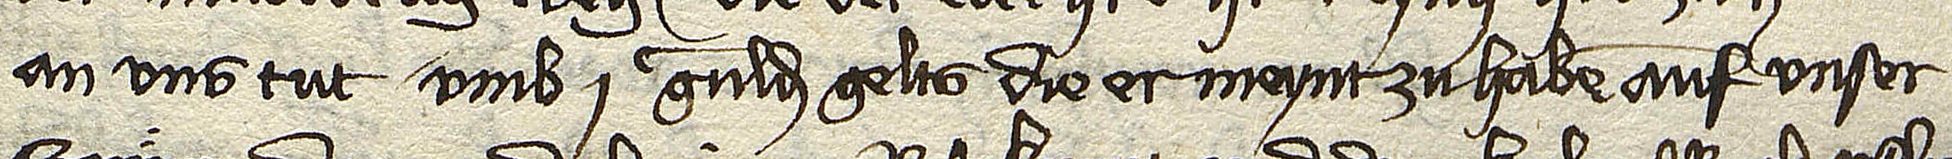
an vns tut / vmb i* guld* gelts die er meynt ʒu habe* auf vnſer
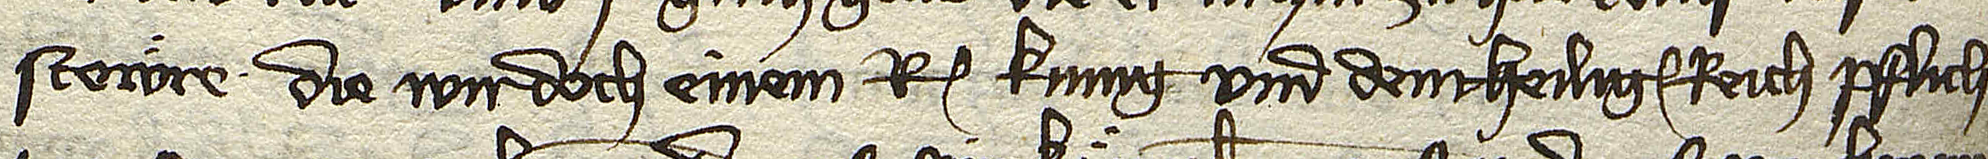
ſteẅre . die wir doch einem R* kunig vnd dem heilig* Reich pflich
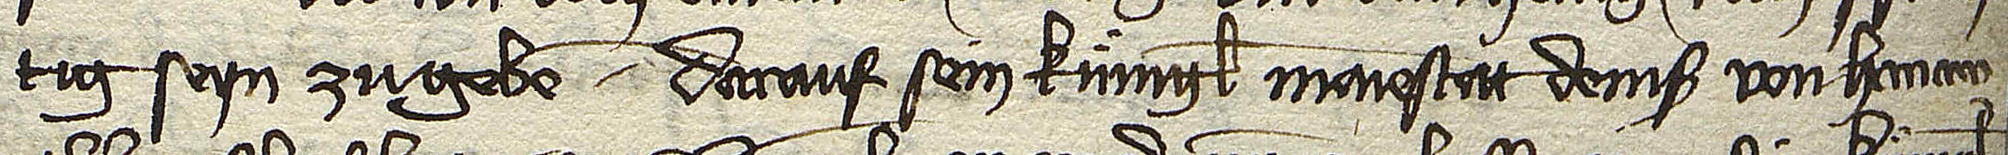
tig ſeyn ʒugebe* / Darauf ſein künigl* maieſtat demſ* von hanaw
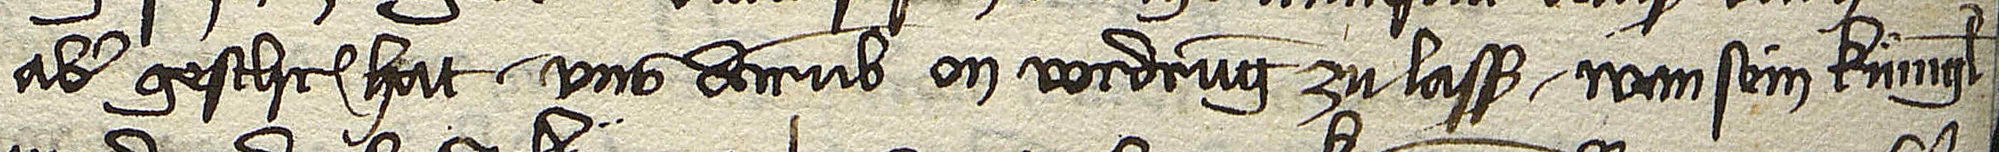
ab* geſchr* hat / vns darub* on vordru*g ʒu laſſ* / wan ſein künigl*
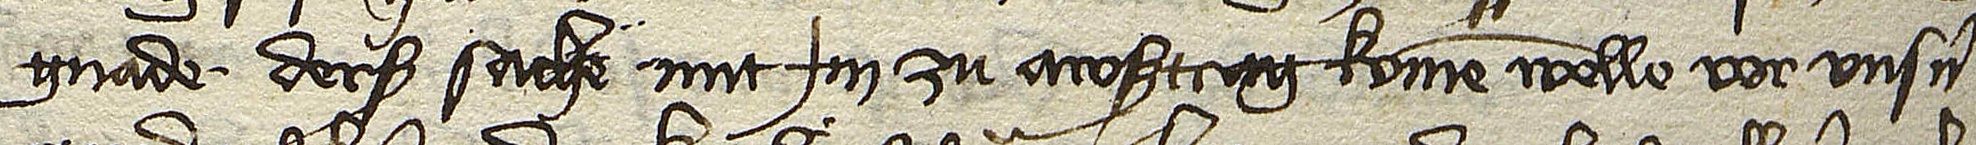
gnade . derſ* ſache mit Im ʒu awſʒtrag kome* welle vor vnſ*n
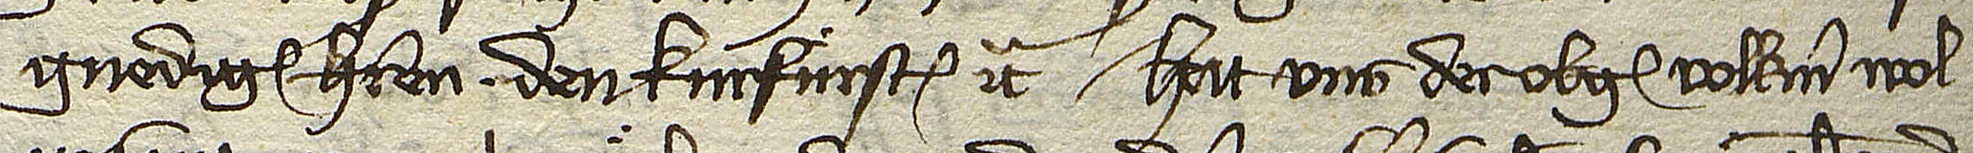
gnedig* h*ren . den kurfürſt* ec* / Hat vns der obg* volkm* wol
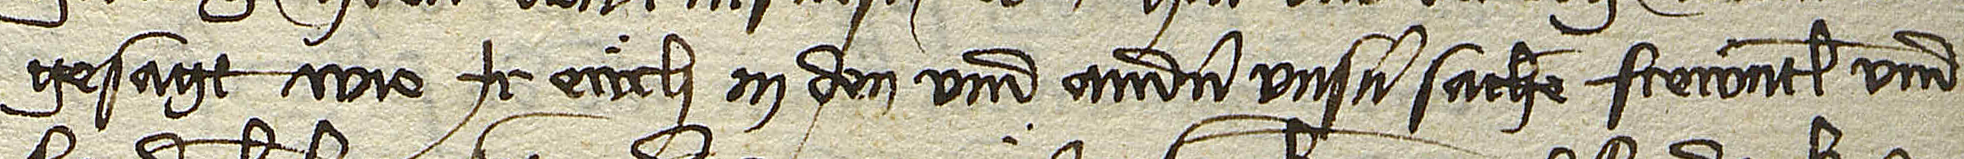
geſagt wie Ir eẅch in den vnd and*n vnſ*n ſache* freẅntl* vnd
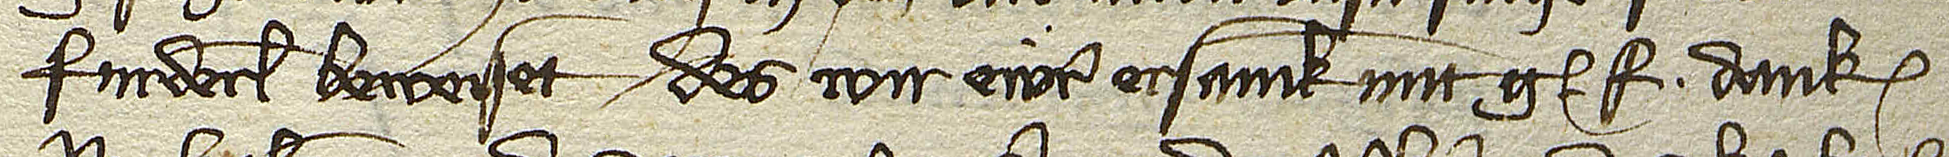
furderl* beweiſet / Des wir eẅr* erſamk* mit g* f* . dank*
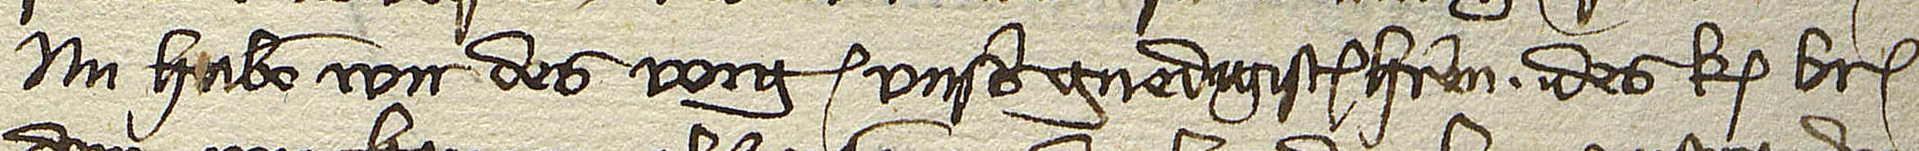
Nu habe* wir des vorg* vnſ*s gnedigiſt* h*ren ~ des k* br*
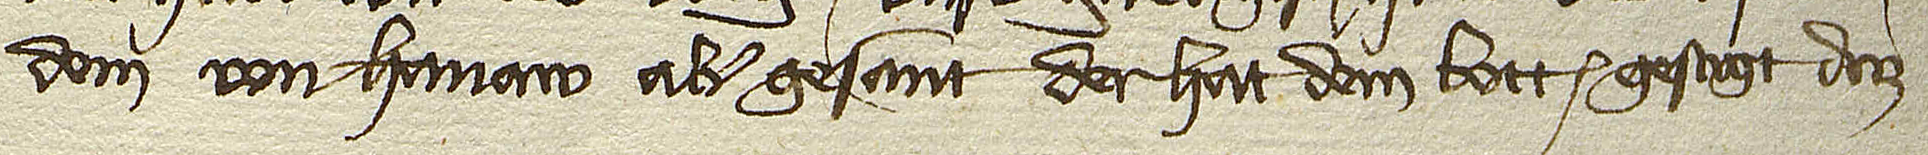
dem von hanaw ab* geſant der hat dem bott* geſagt daʒ
